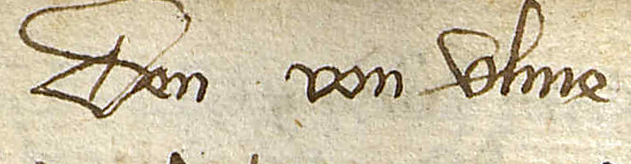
Den von Vlme
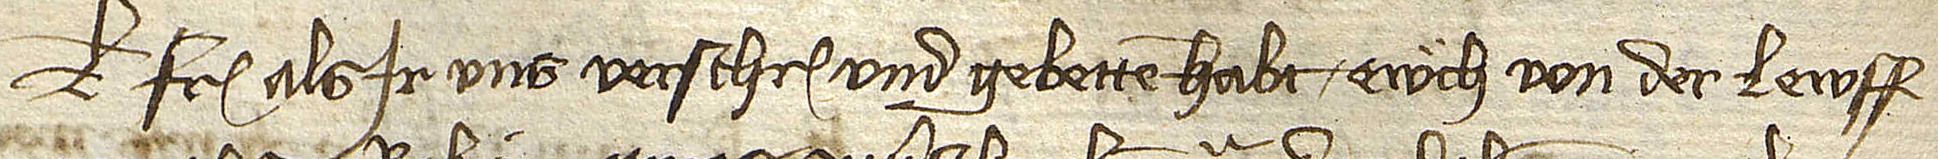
L* fr* als Ir vns verſchr* vnd gebette* habt / eẅch von der lewff
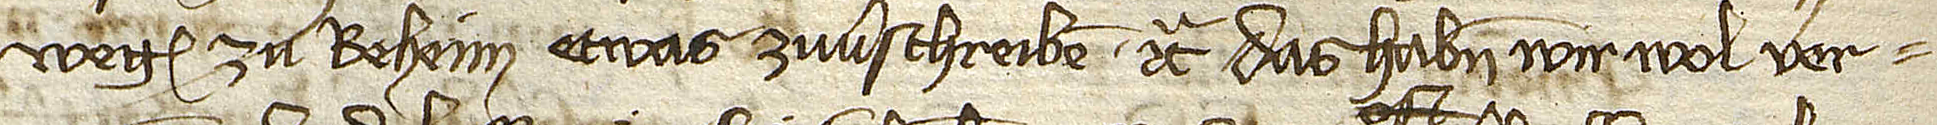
weg* ʒu Beheim etwas ʒuu*ſchreibe* / ec* / Das habn* wir wol ver =
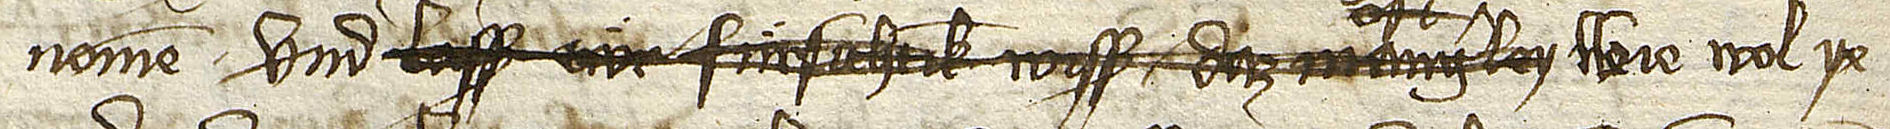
nome* / Vnd laſſ* eẅr fürſtichtik* wiſſ* / daʒ mang*ley wie wol ye
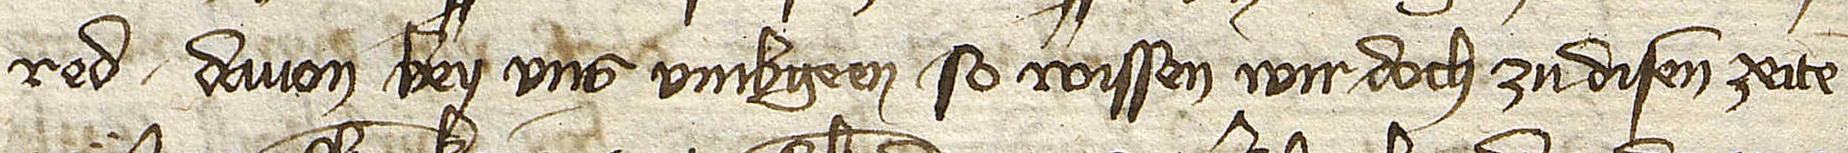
red / dauon / bey vns vmbgeen / ſo wiſſen wir doch ʒu diſen ʒeite*
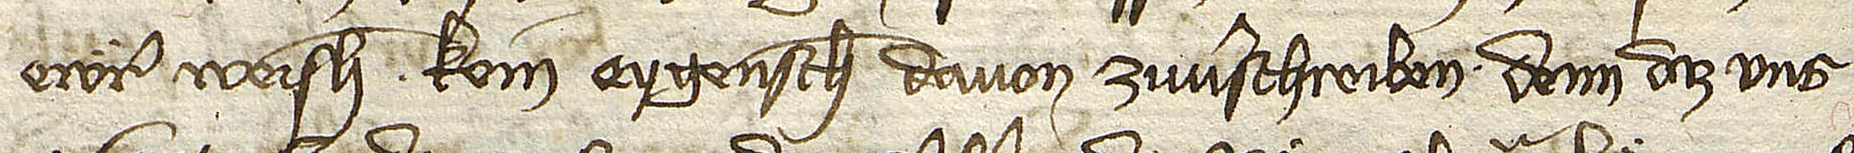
eẅr* weiſh* kein eygenſch* dauon ʒuu*ſchreiben . Denn daʒ vns
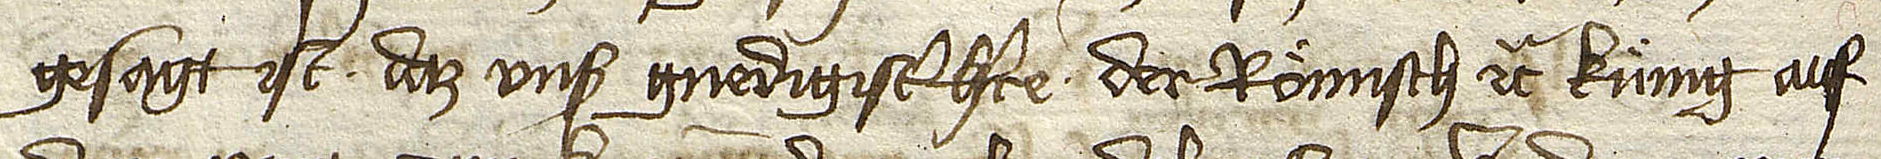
geſagt iſt . daʒ vnſ* gnedigiſt* h*re . Der Römiſch ec* künig auf
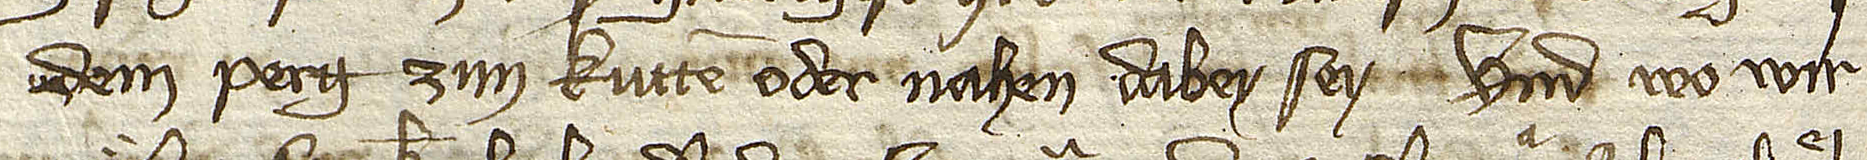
dem perg ʒum kutte* oder nahen dabey ſey Vnd wo wir
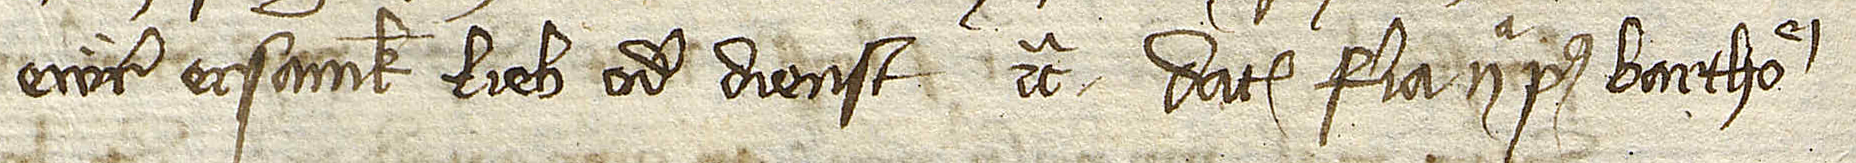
eẅr* erſamk* lieb od* dienſt ec* / Dat* fi*a ii* p* bartho*
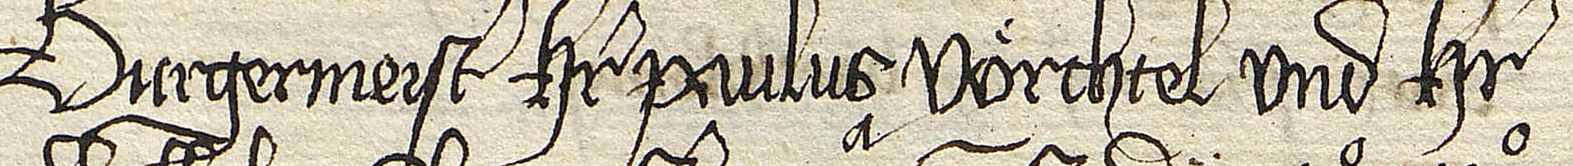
Burgermeiſt* Hr* Paulus Vörchtel vnd Hr*
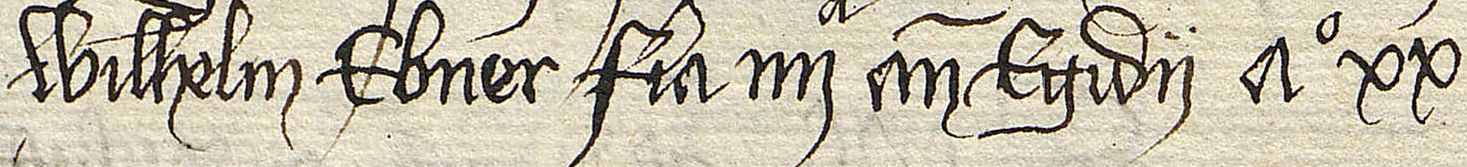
Wilhelm Ebner fi*a iiii* an* Egidii A* xx*
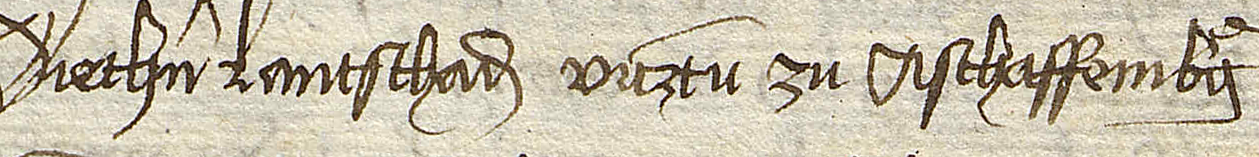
Diethn* lantſchad* vicʒtu* ʒu Aſchaffemb*g
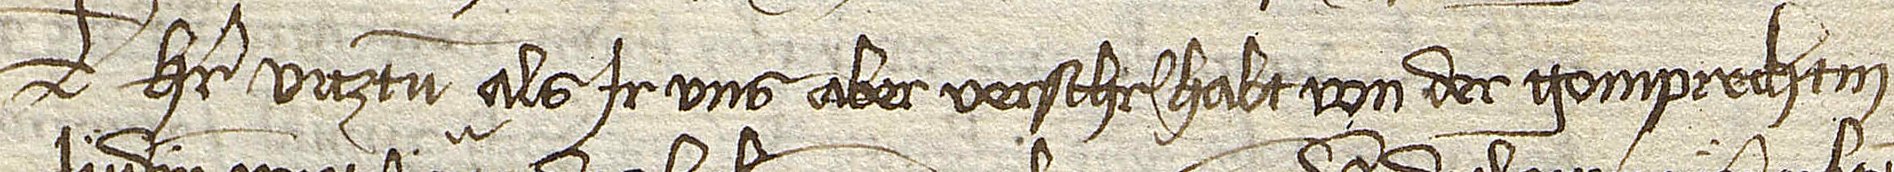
L* Hr* vicʒtu* als Ir vns aber verſchr* habt von der gomprechtin
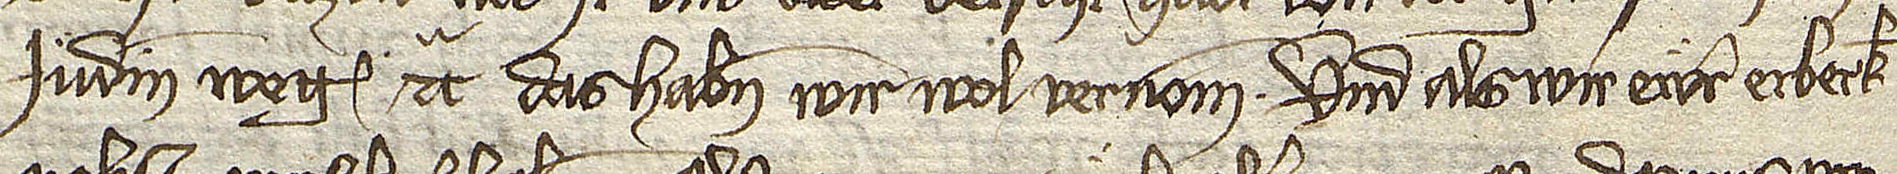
Iüdin* weg* ec* das habn* wir wol vernom* . Vnd als wir eẅr* erberk*
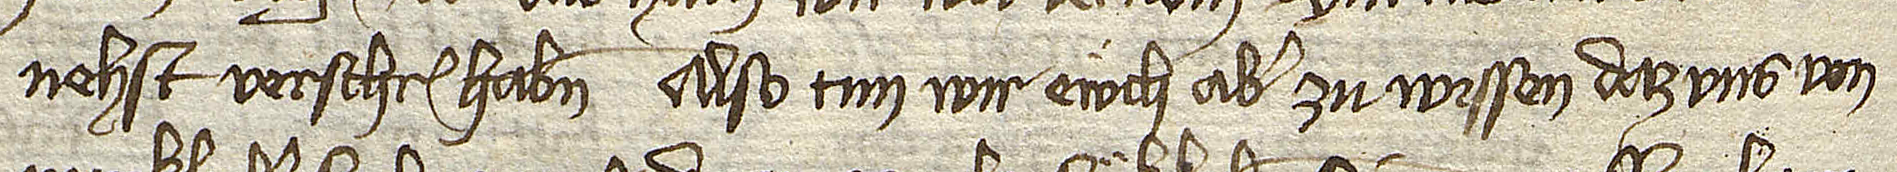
nehſt verſchr* habn* Alſo tun wir eẅch ab* ʒu wiſſen daʒ vns von
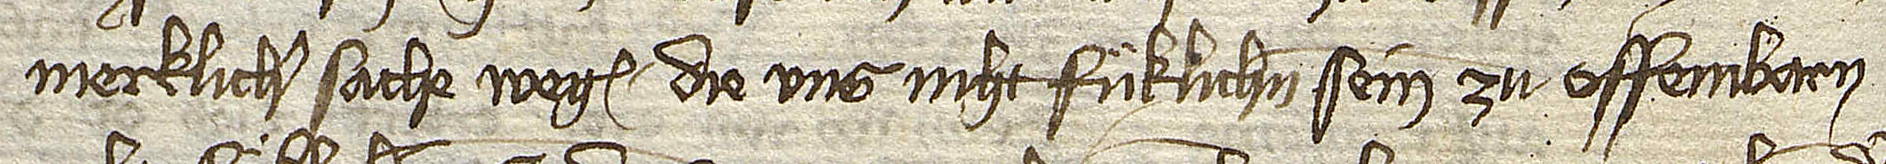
merklich* ſache weg* / die vns niht füklichn* ſein ʒu offembarn
